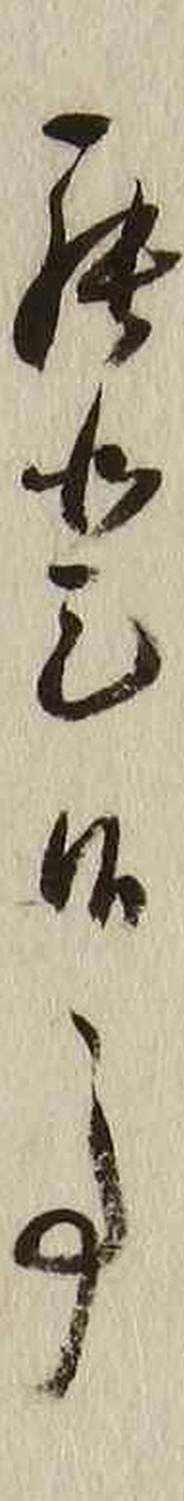罷登候事
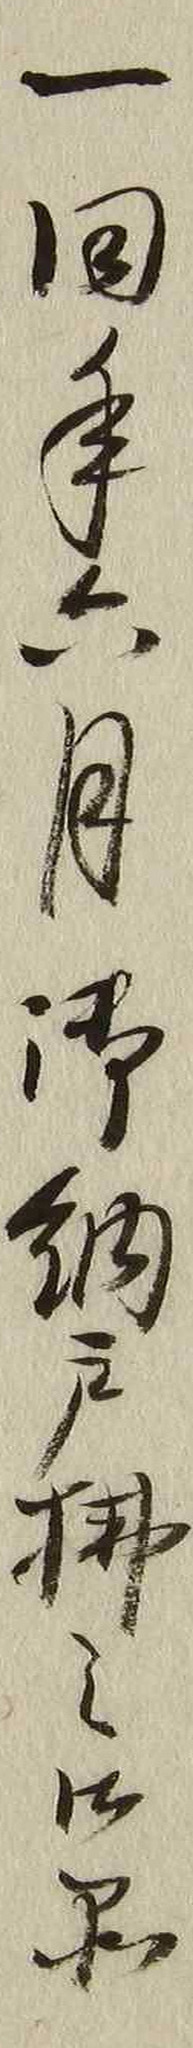一同年六月御納戸払之御品
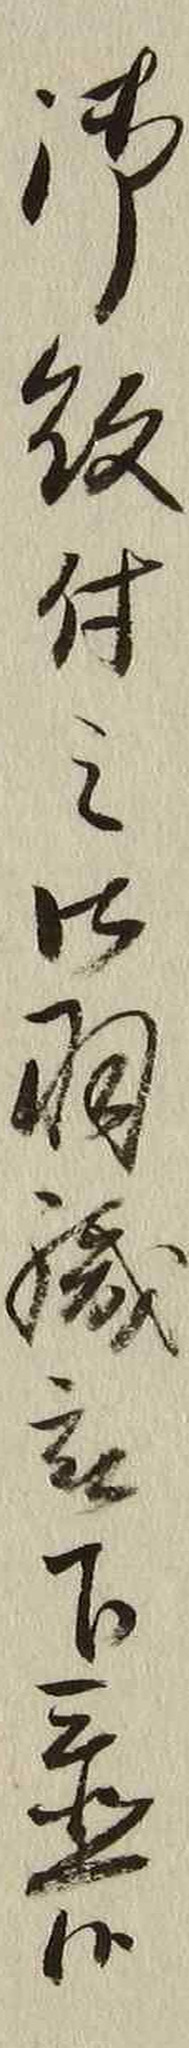御紋付之御羽織被下置候
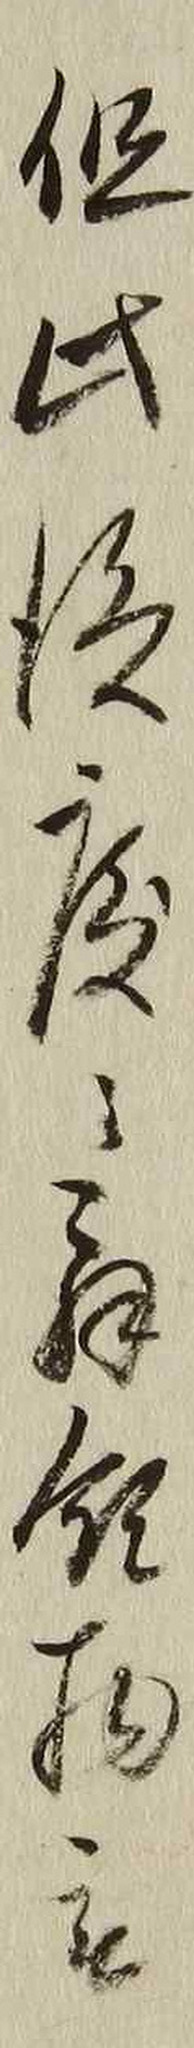但此後度々拝領物被
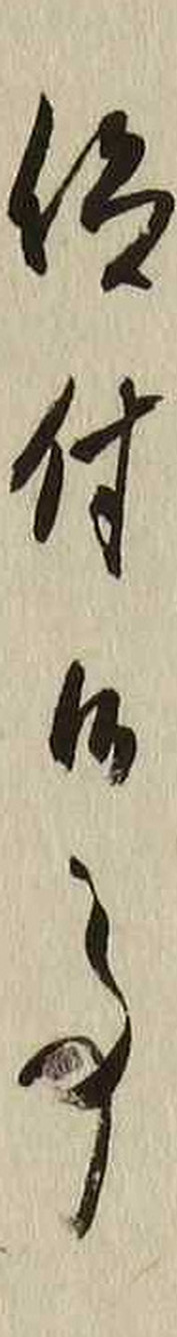仰付候事
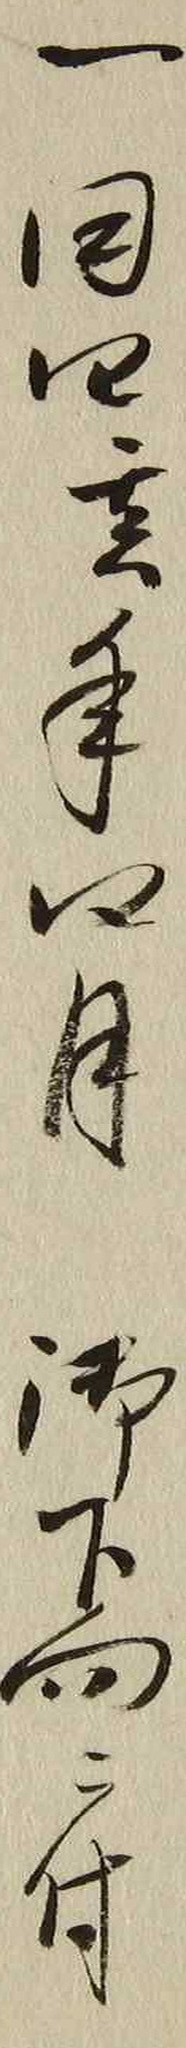一同四亥年四月御下向ニ付
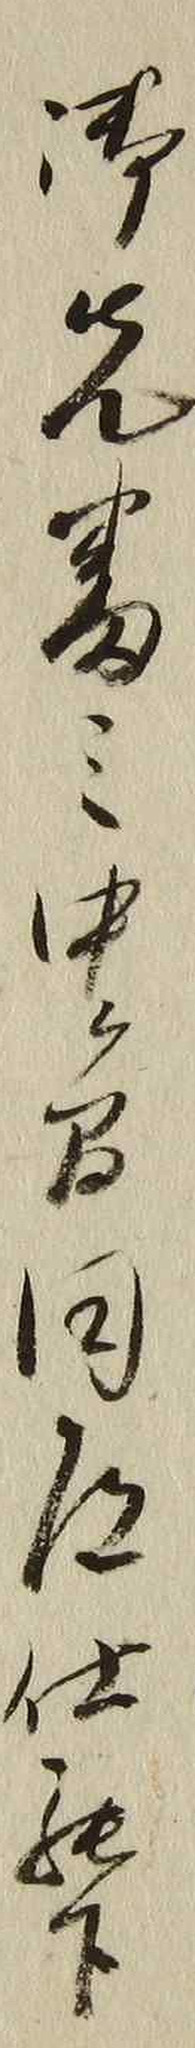御先番之中ケ間同道仕罷下
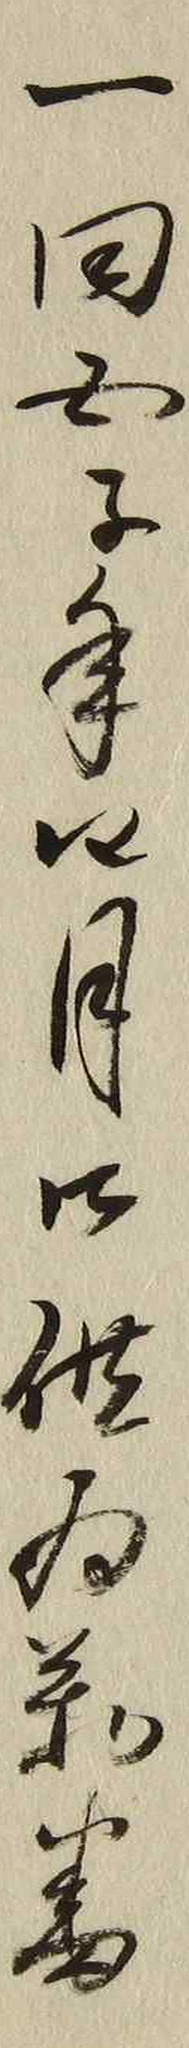一同五子年四月御供為勤番
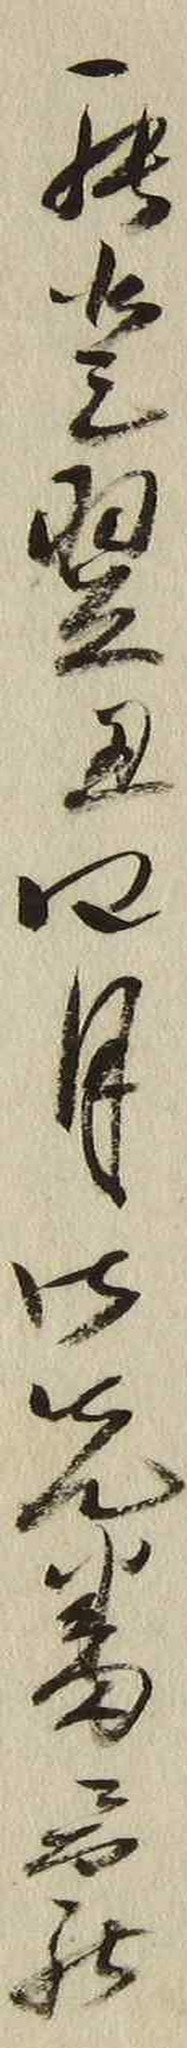罷登翌丑四月御先番ニ而罷
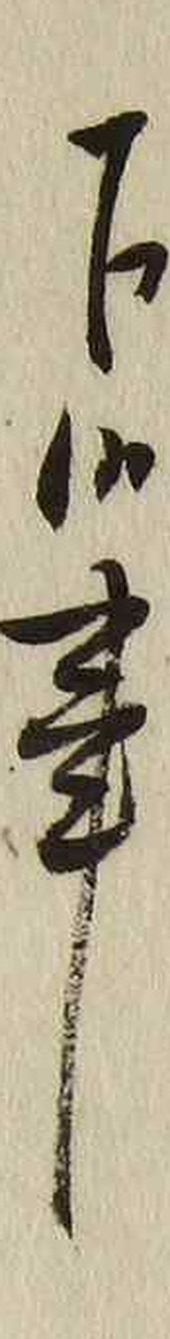下候事
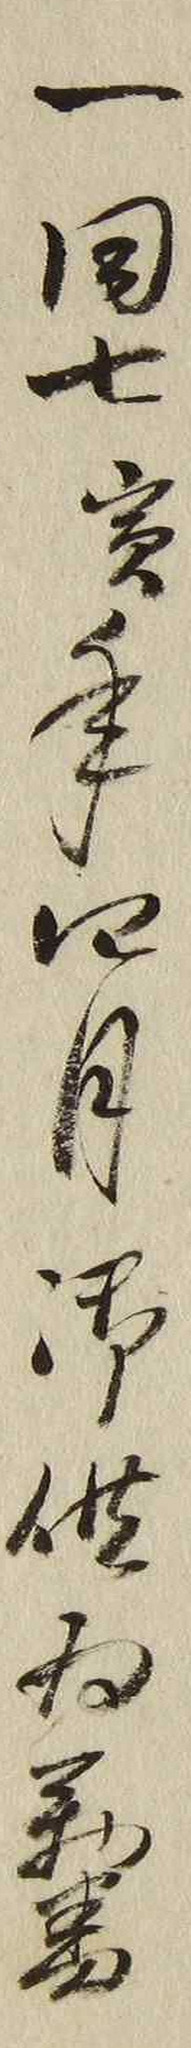一同七寅年四月御供為勤番
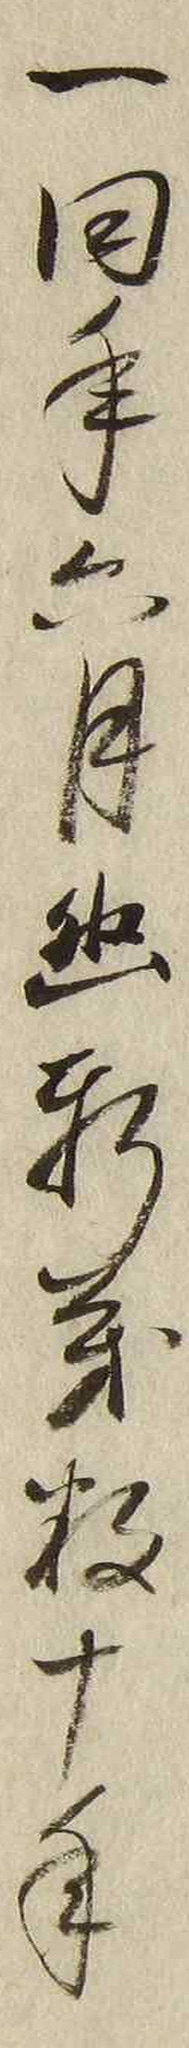一同年六月幽軒義数十年

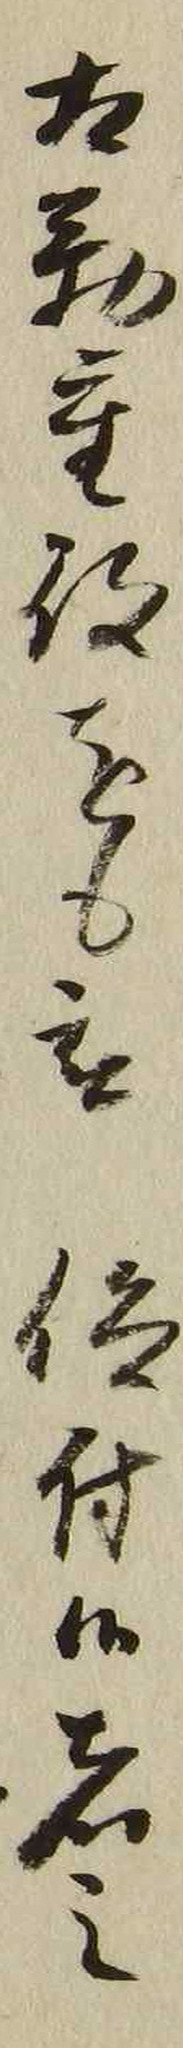相勤重役をも被仰付候者之
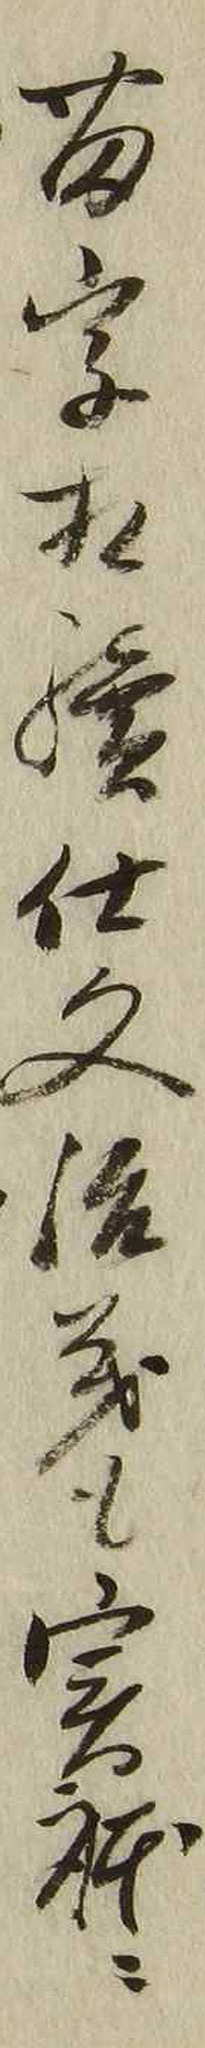苗字相続仕文治義も実体ニ
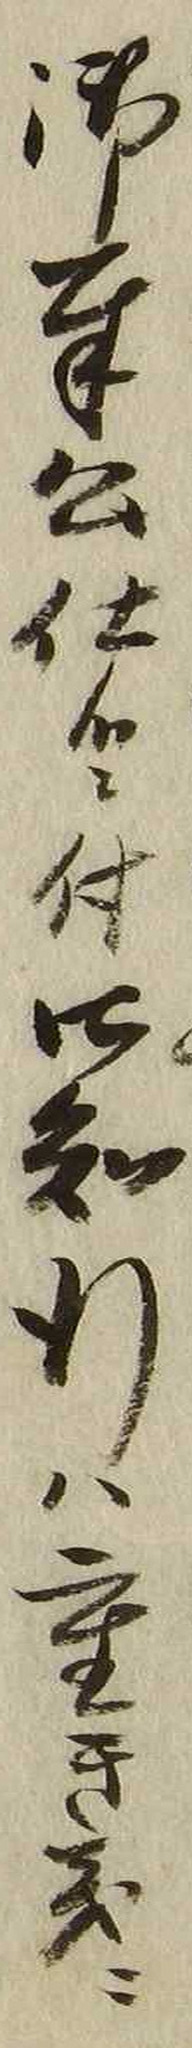御奉公仕候ニ付御知行ハ重き義ニ
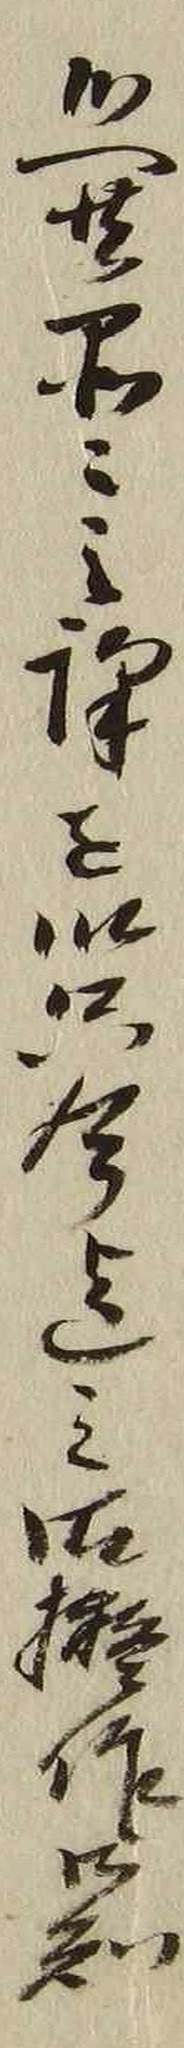候へ共品々之訳を以只今迄之御擬作御知
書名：諸士系譜　巻之355　す之部5
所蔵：会津若松市立会津図書館
